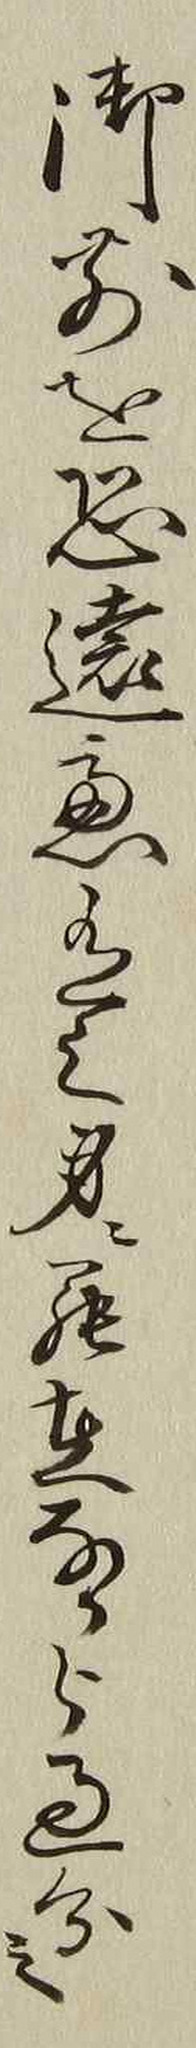御前を恐遠慮有之身ニ罷在なから過分之
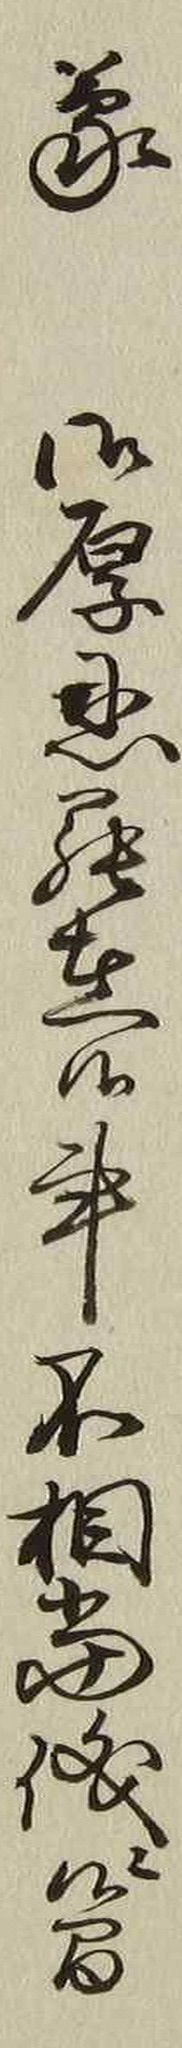蒙御厚恩罷在候事不相当儀ニ候間
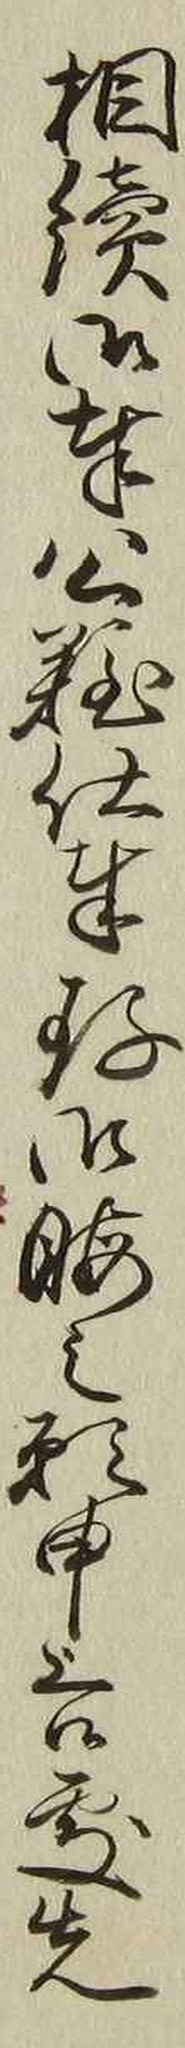相続御奉公難仕奉存御暇之願申上候処先
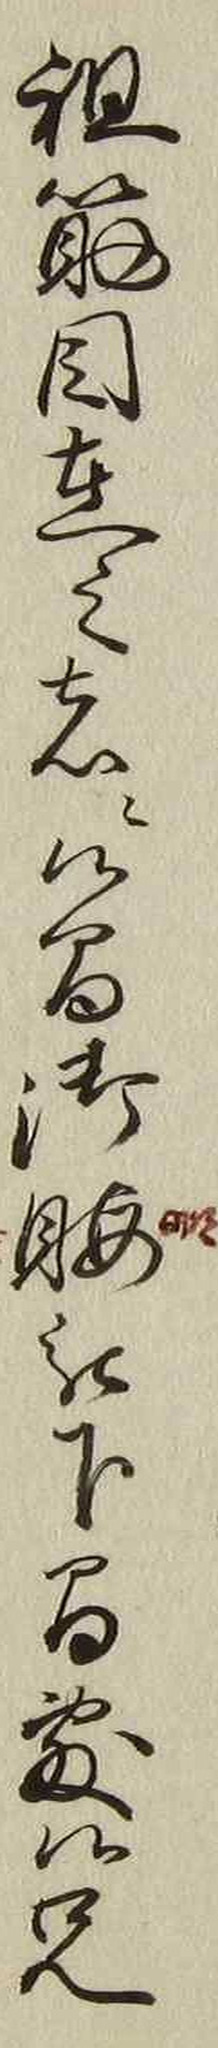祖筋目在之者ニ候間御暇被下間敷候兄
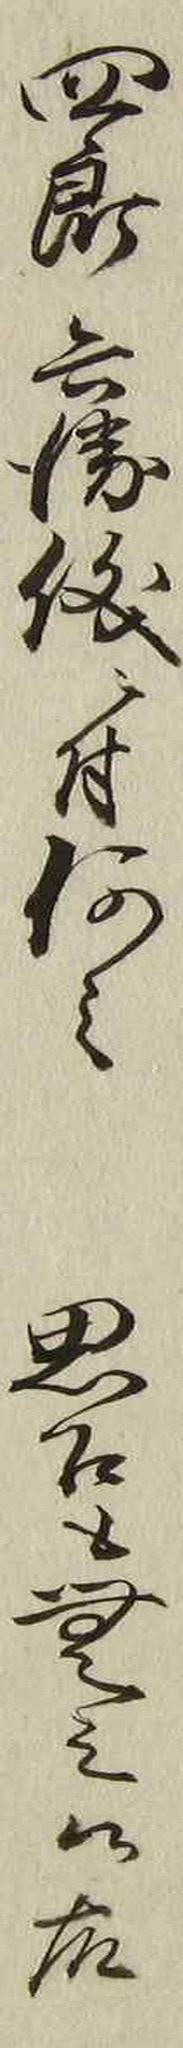四郎兵衛儀ニ付何之思召も無之候故
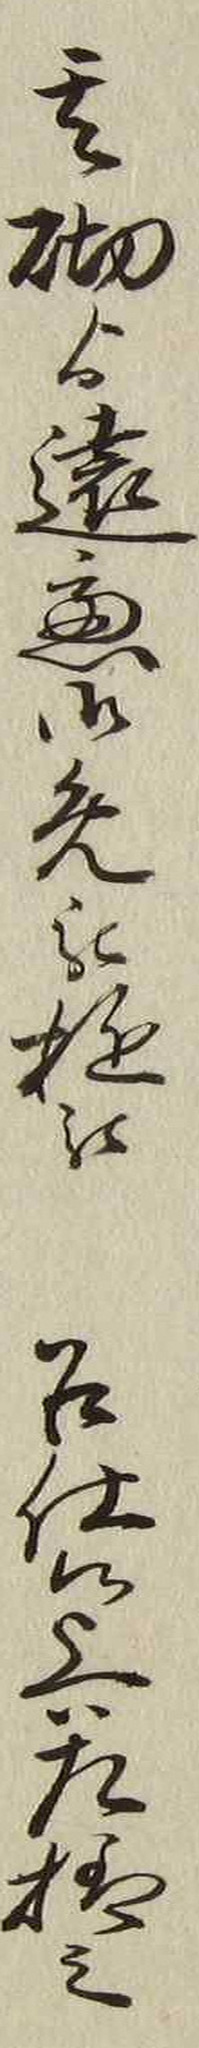其砌ゟ遠慮御免被遊被召仕候上ハ左様之
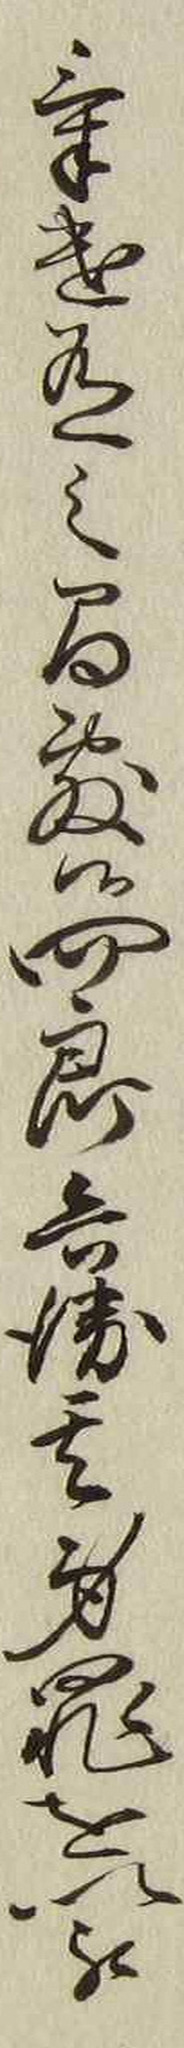気遣有之間敷候四郎兵衛其身罪を以被
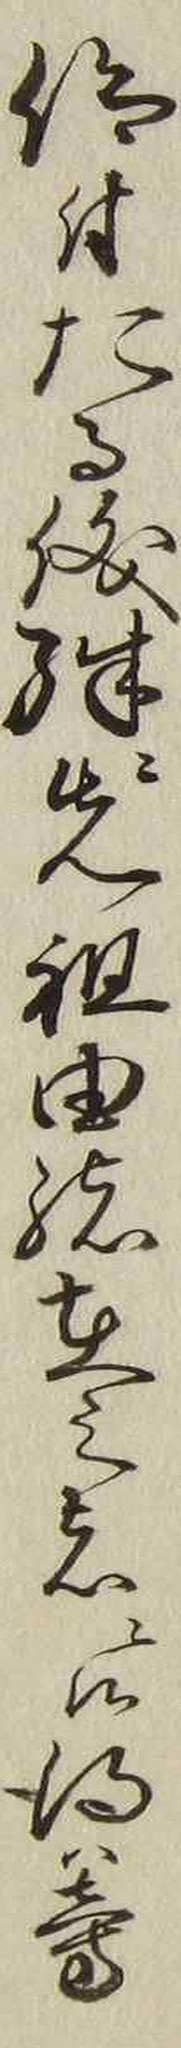仰付たる儀殊ニ先祖由緒在之者ニ候得ハ旁
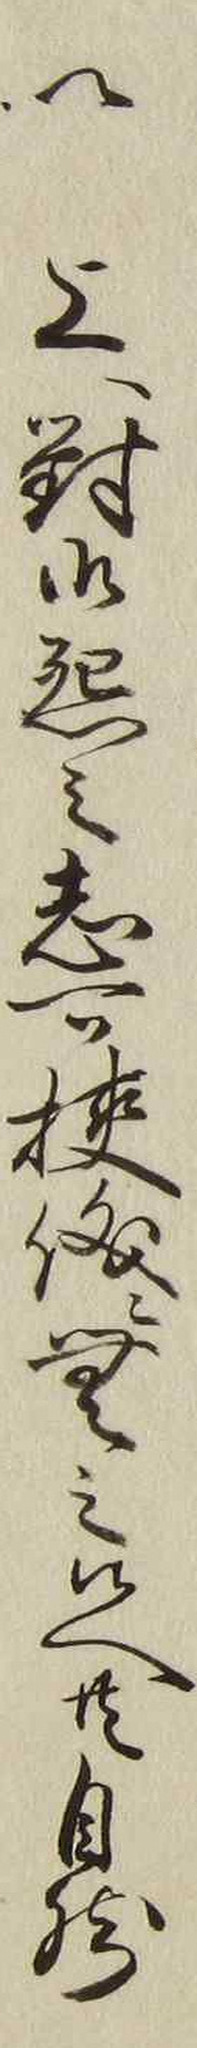以上へ対御怨之志可挟儀ニ無之候へ共自然

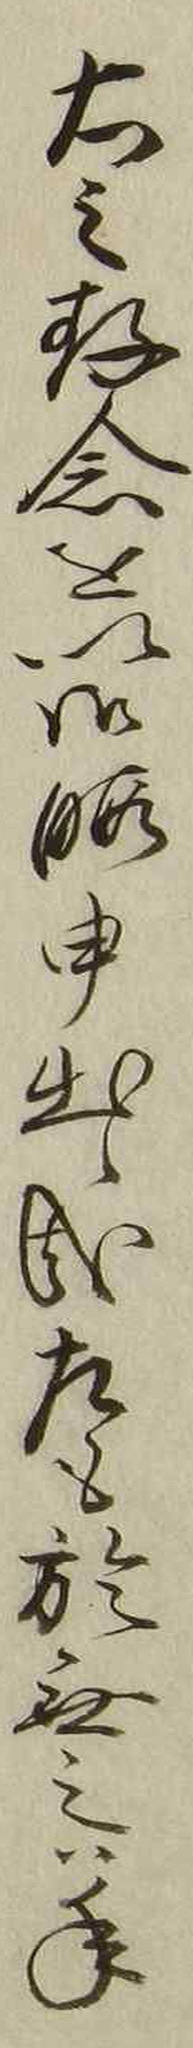右之存念を以御暇申出候哉左も於無之ハ年
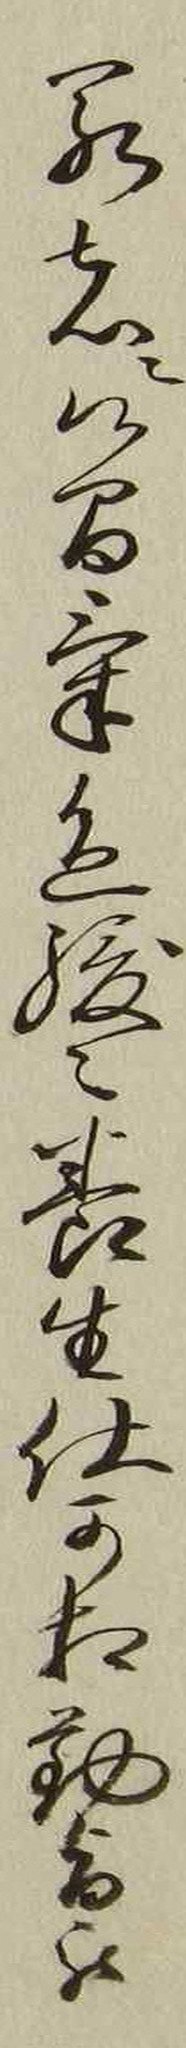若者ニ候間気色緩々養生仕可相勤旨被
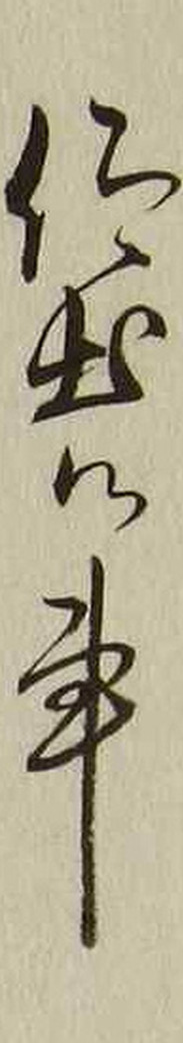仰出候事
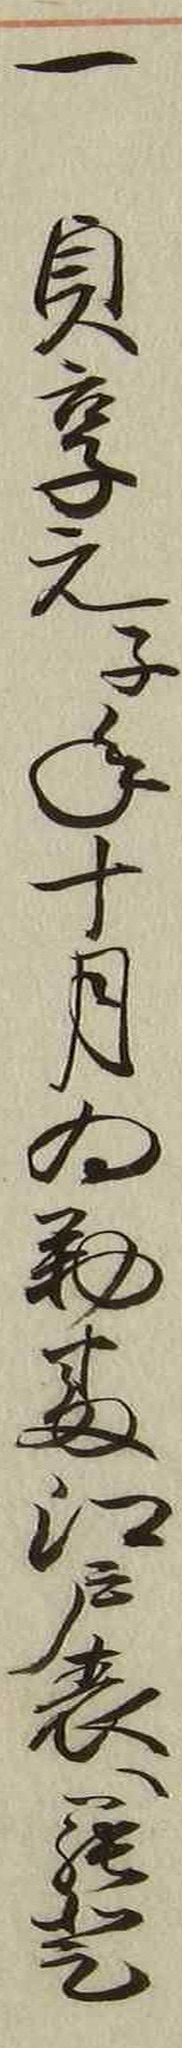一貞享元子年十月為勤番江戸表へ罷登
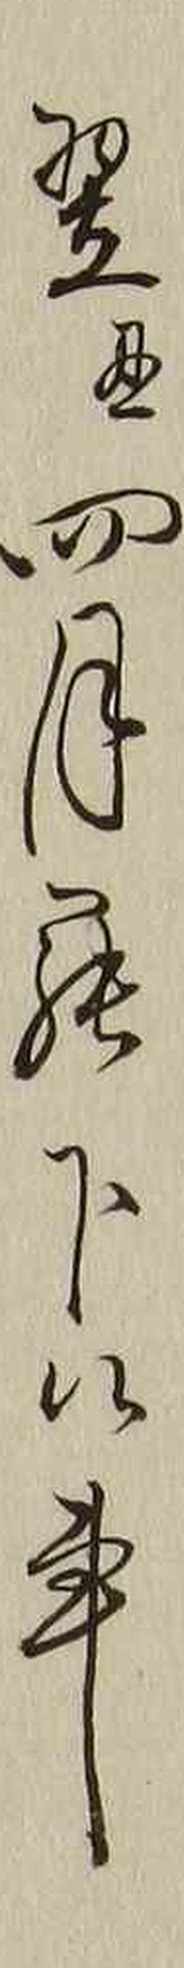翌丑四月罷下候事
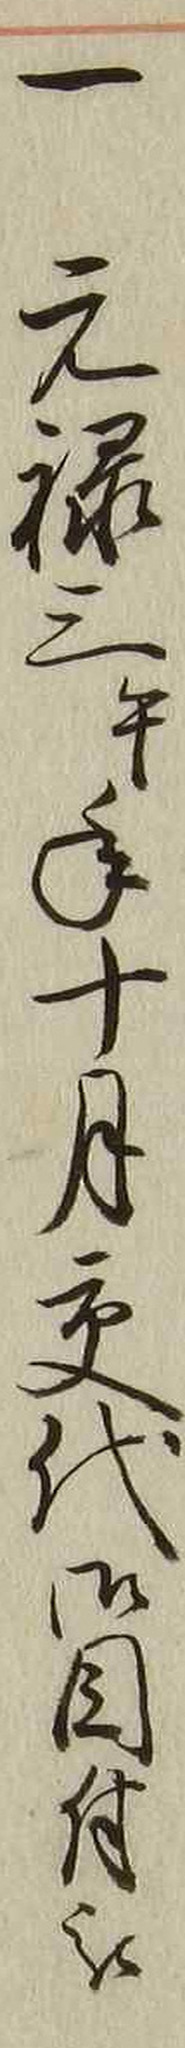一元禄三午年十月交代御目付被
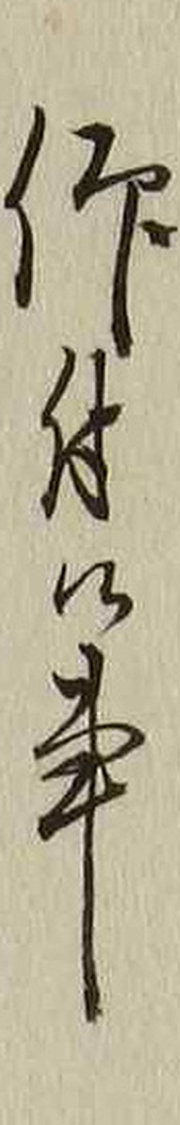仰付候事
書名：諸士系譜　巻之21　い之部21
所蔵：会津若松市立会津図書館
